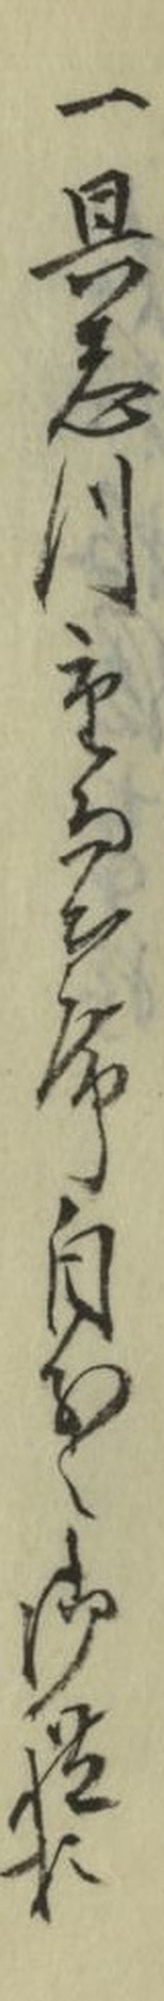一具志川重而出席自分之御礼於
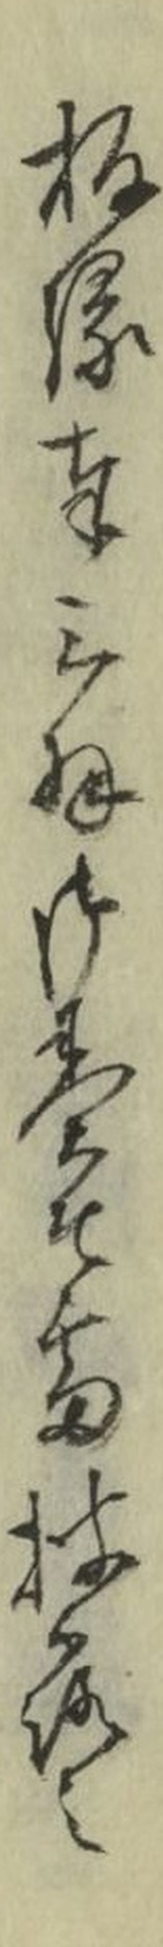板縁奉三拝御奏者番披露之
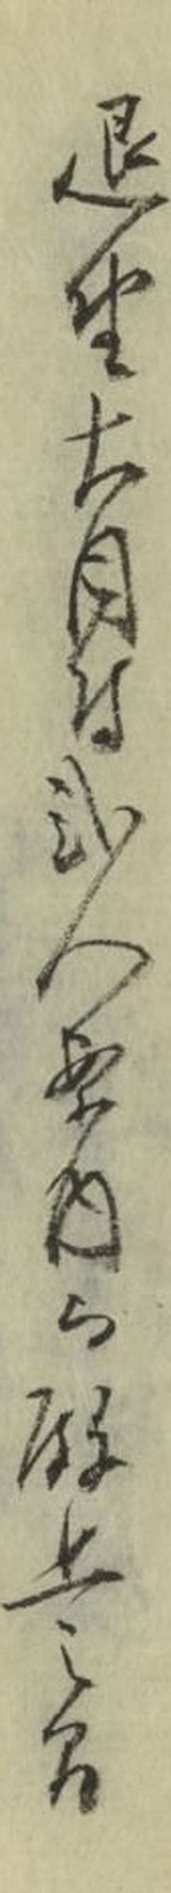退坐大目付弐人案内而殿上之間
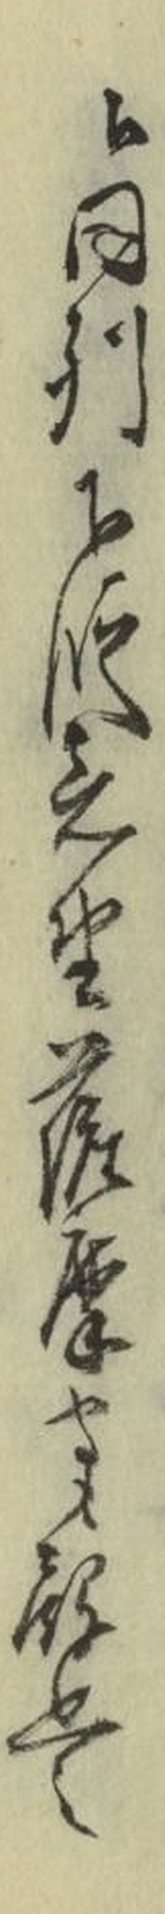え同列下段着坐薩摩守も殿上之

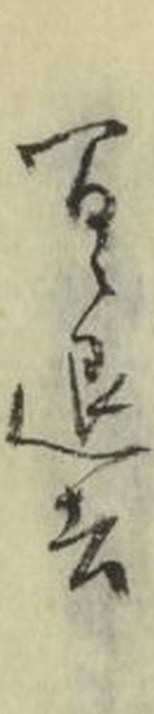間に退去
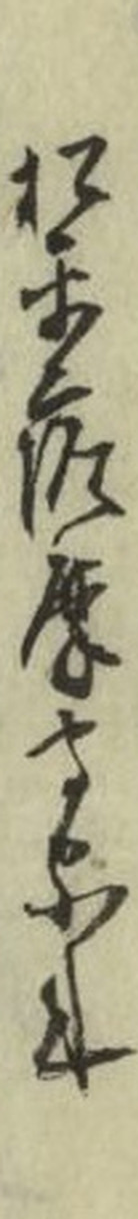松平薩摩守家来
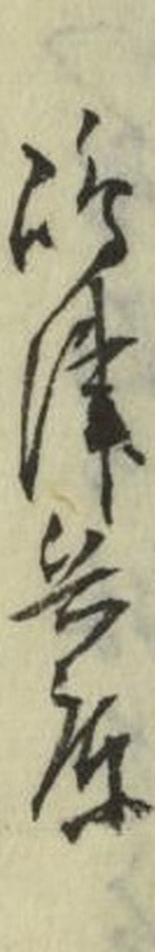島津兵庫
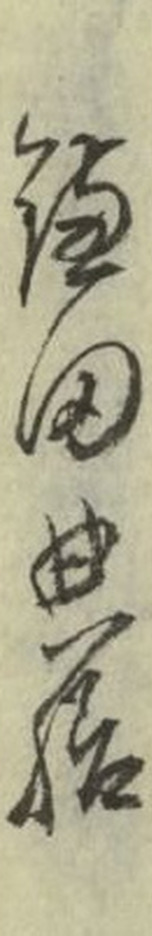鎌田典膳
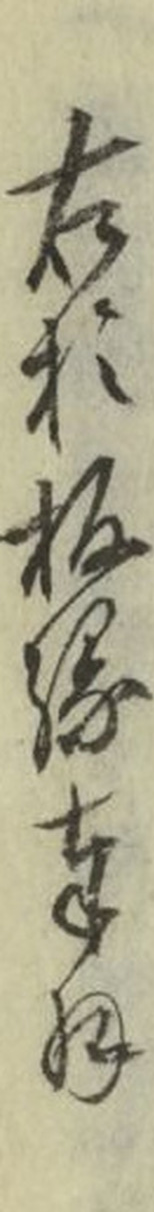右於板縁奉拝
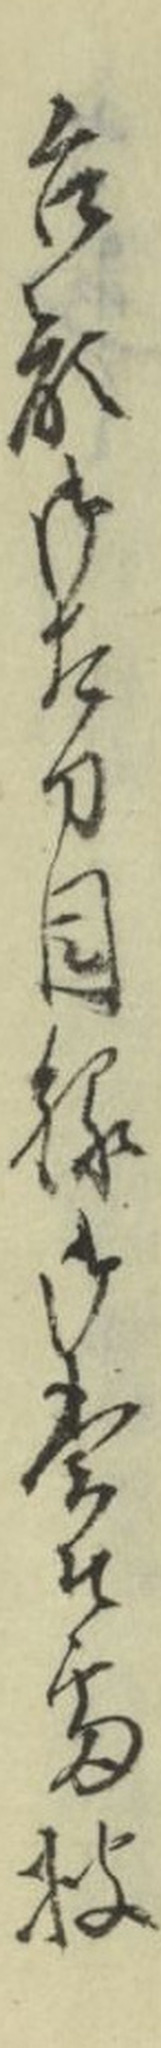台顔御太刀目録御奏者番披
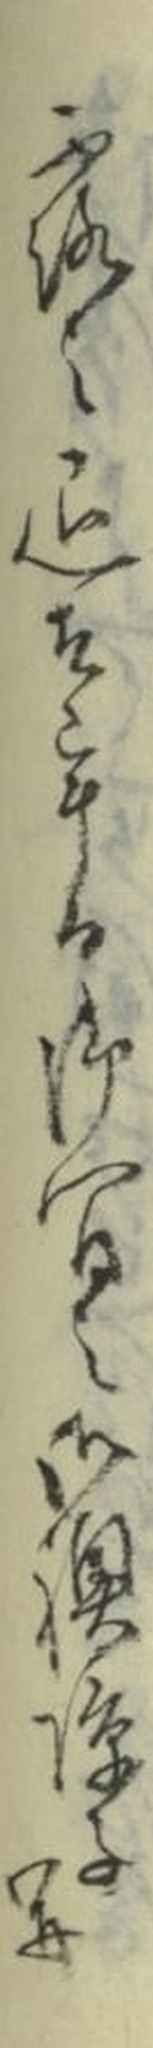露之退去畢而御間之御襖障子開
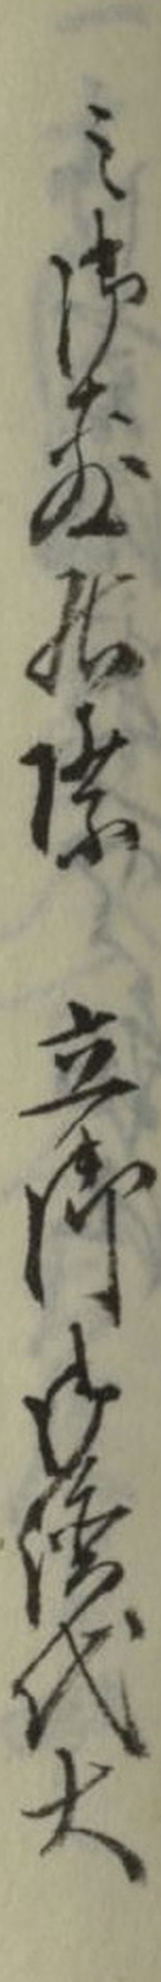之御敷居際立御御譜代大
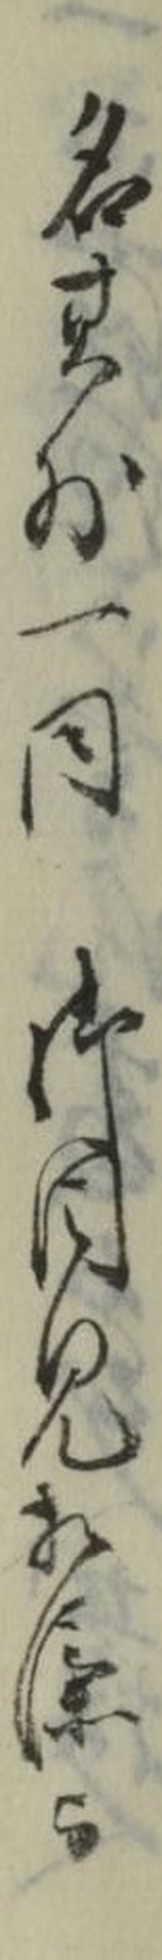名其外一同御目見相済而
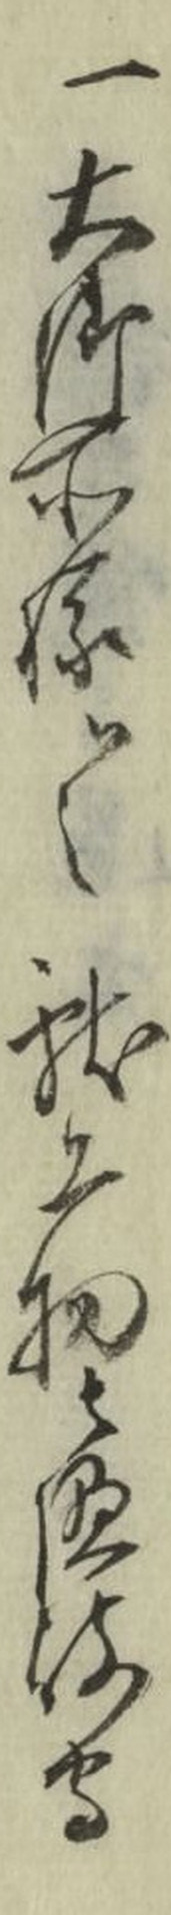一大御所様え之献上物は隠岐守
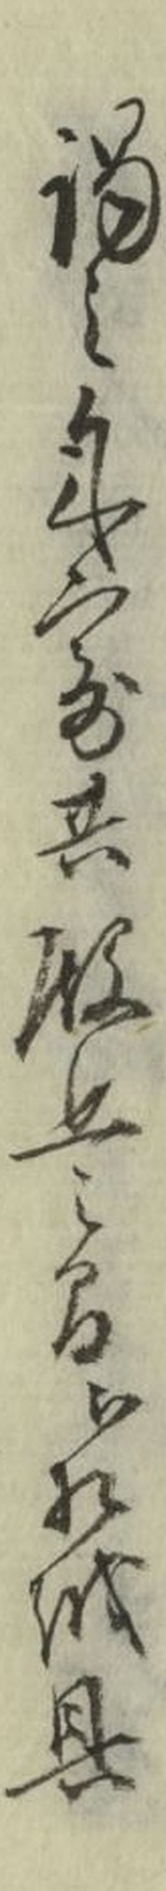謁之年寄共殿上之間え相越具
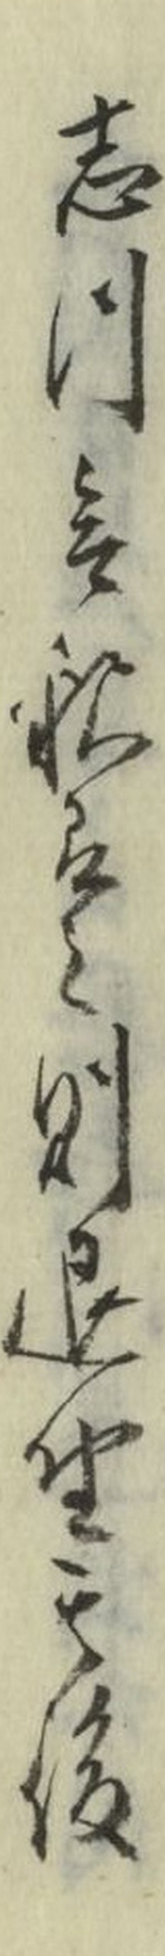志川会釈有之則退坐其後
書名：琉球人来朝記 三
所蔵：University of the Ryukyus Library
